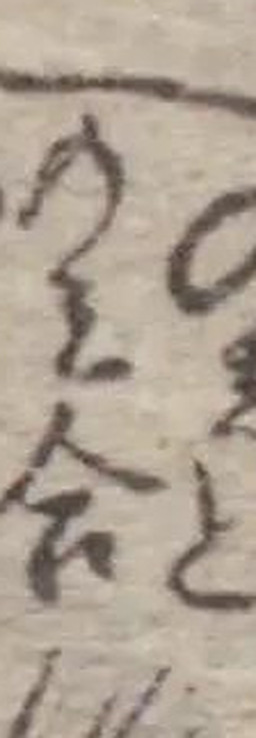もみ合
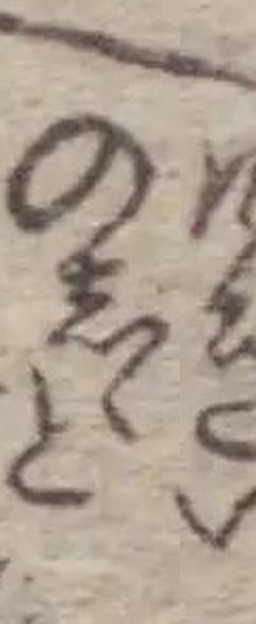のしゝと
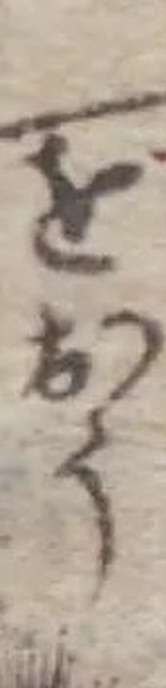をおう
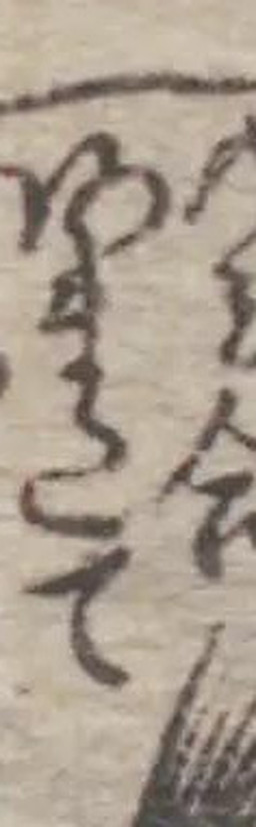あまたて
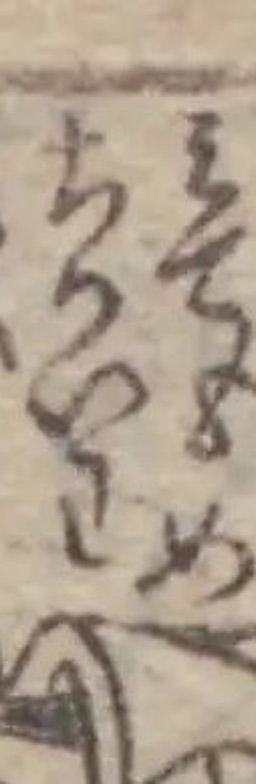ちかいわ
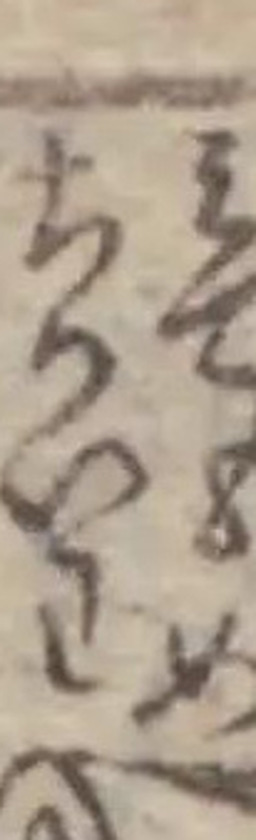ちかいわ
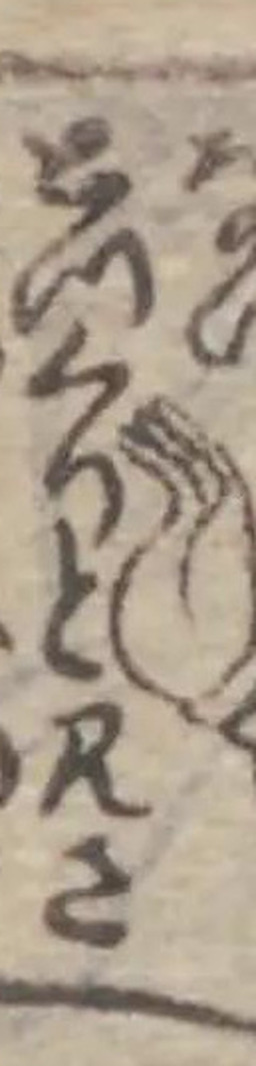とつくりと見さ
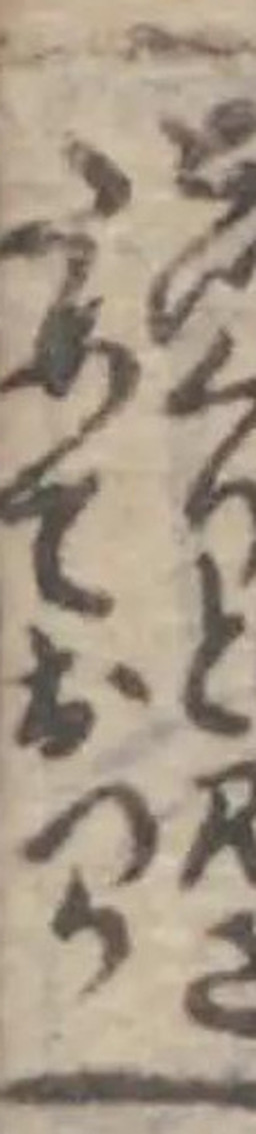ためておつか
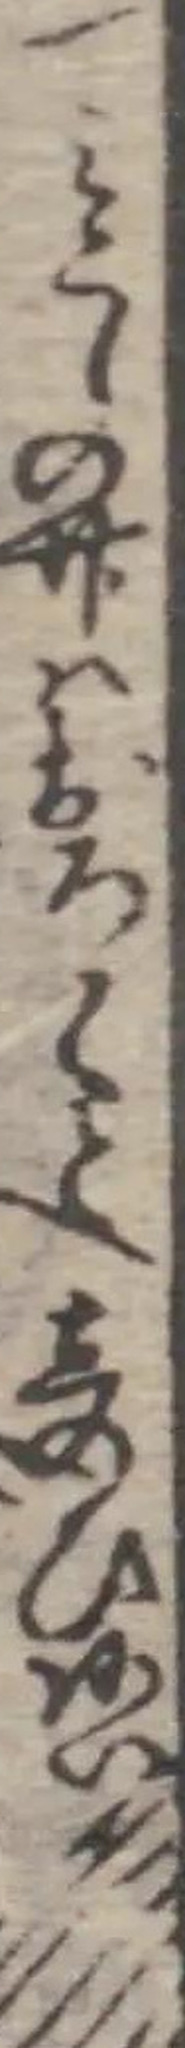みこしの介はおろくとしのひやい
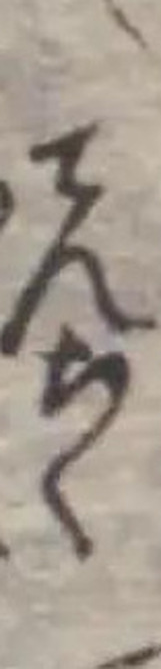てんちく
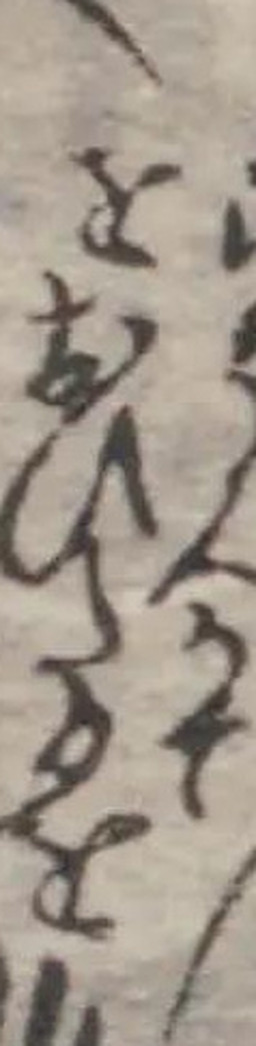をおひたるを
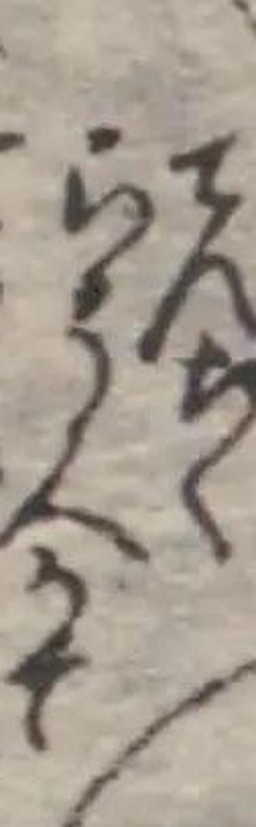らう人かて
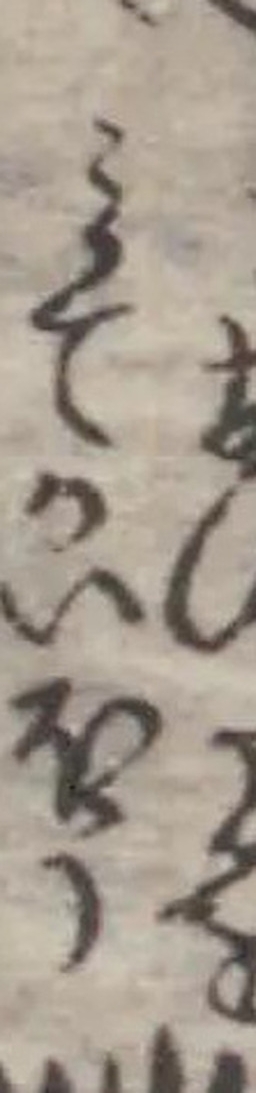みてかいほう
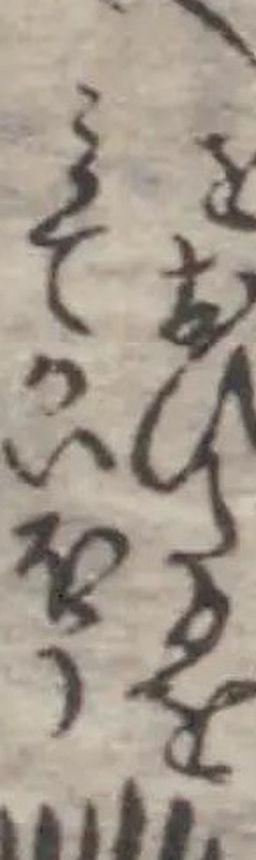みてかいほう
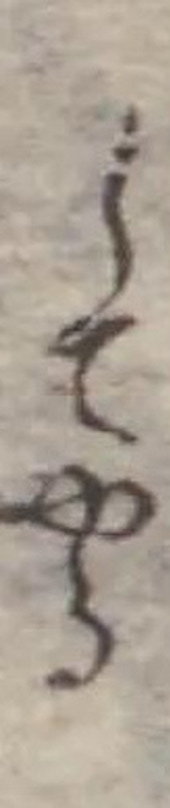してやる

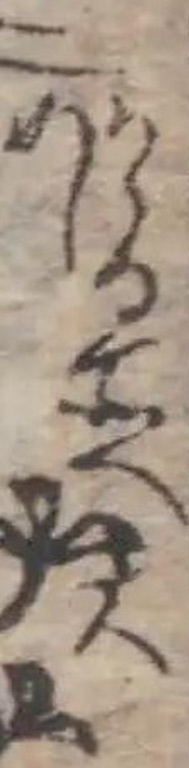かくる所へ大
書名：化物三ツ目大ほうい 2巻
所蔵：国立国会図書館 National Diet Library, JAPAN
